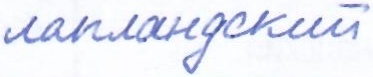лапландский
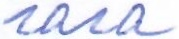гага
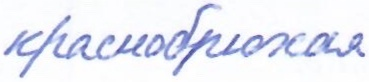краснобрюхая
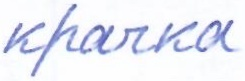крачка
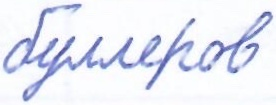буллеров
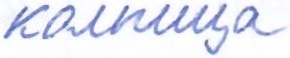колпица
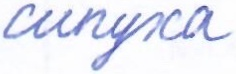сипуха
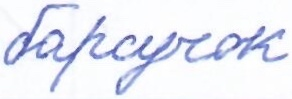барсучок
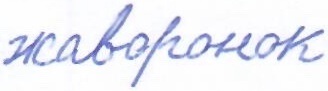жаворонок
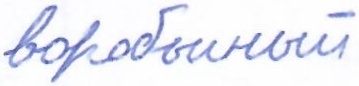воробьиный
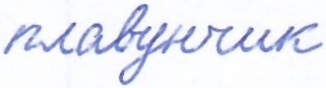плавунчик
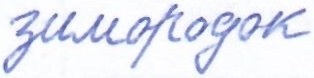зимородок
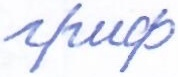гриф
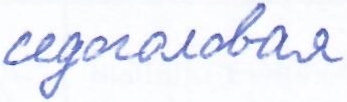седоголовая
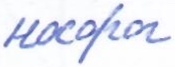носорог
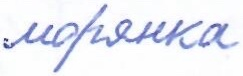морянка
